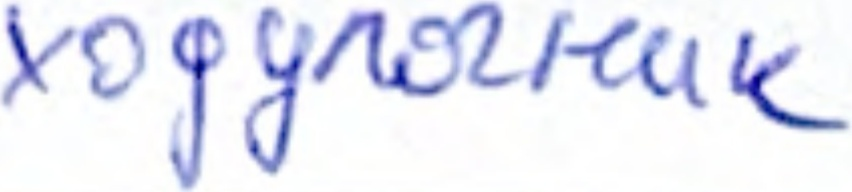ходулочник
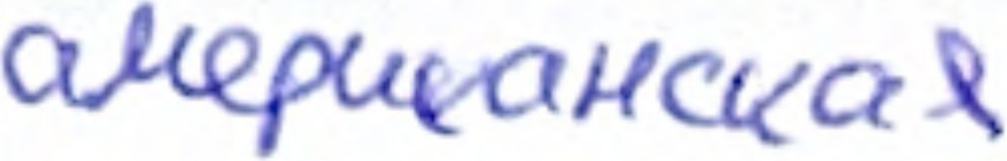американская
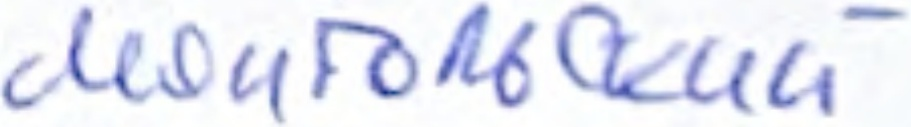монгольский
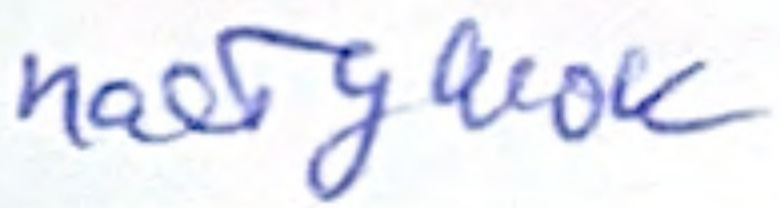пастушок
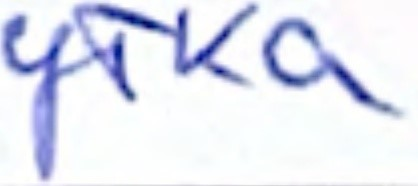утка
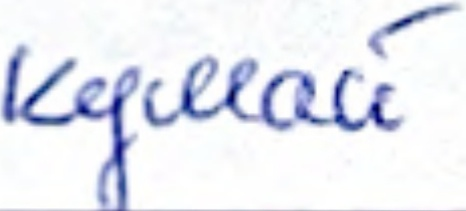кумай
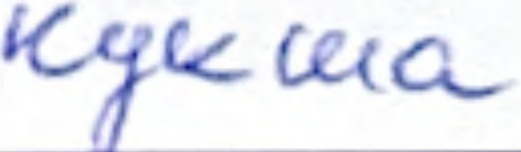кукша
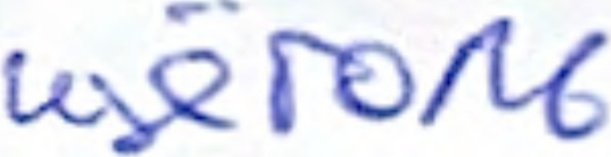щёголь
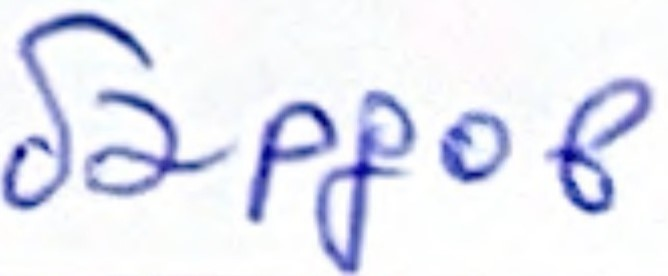бэрдов
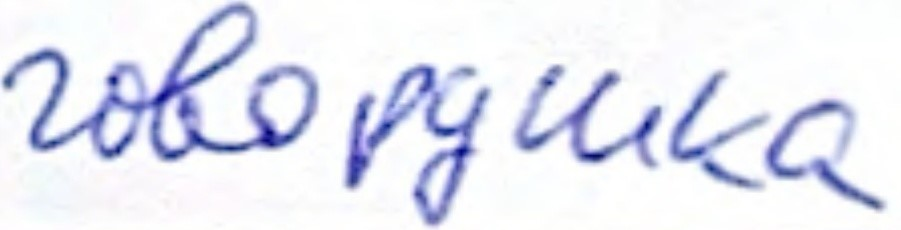говорушка
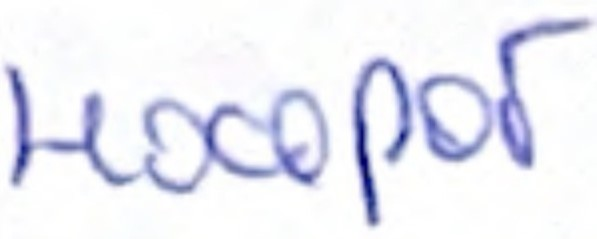носорог
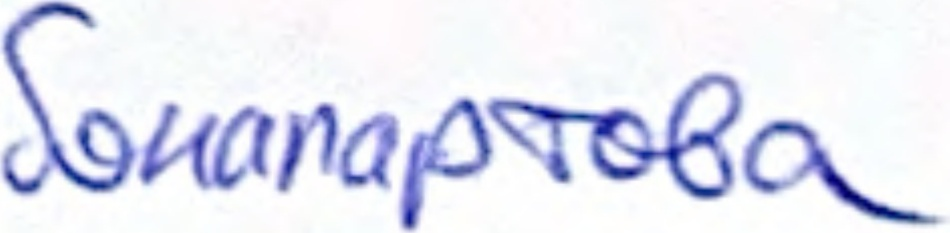бонапартова
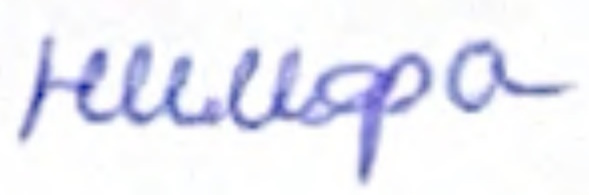нимфа
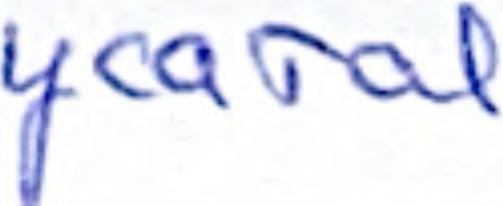усатая
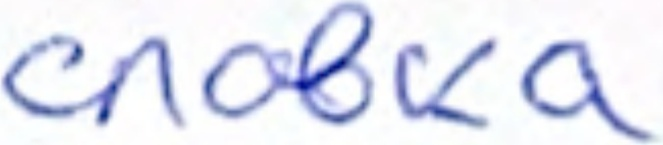славка
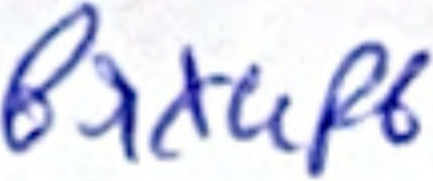вяхирь
